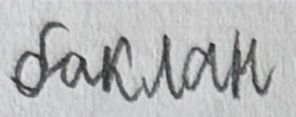баклан
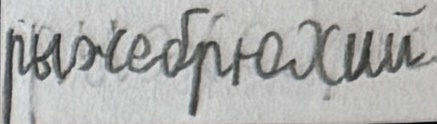рыжебрюхий
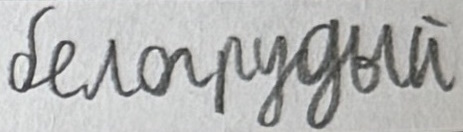белогрудый
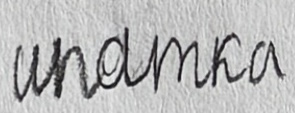ипатка
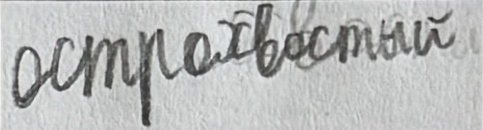острохвостый
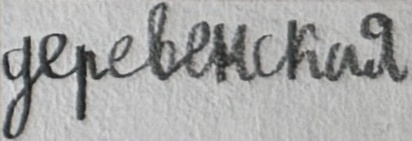деревенская
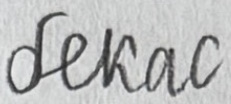бекас
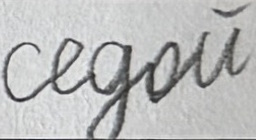седой
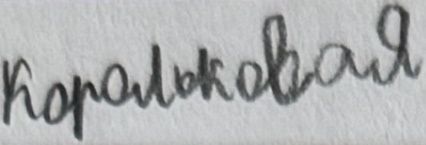корольковая
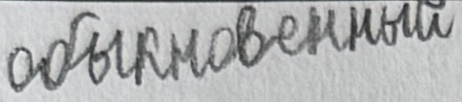обыкновенный
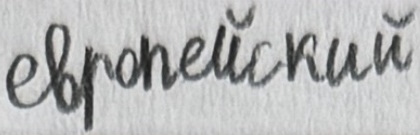европейский
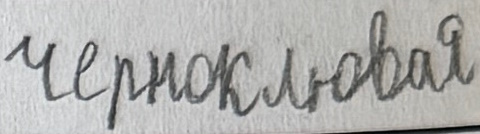черноклювая
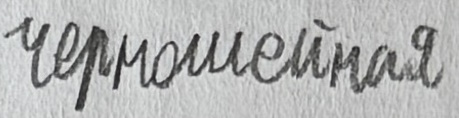черношейная
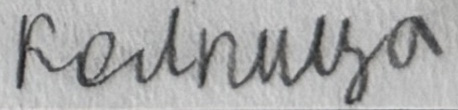колпица
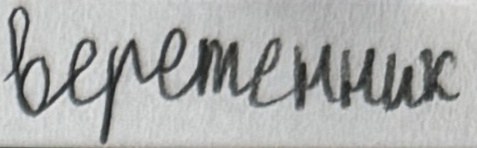веретенник
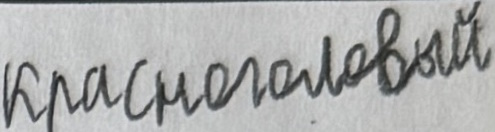красноголовый
